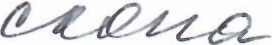скопа
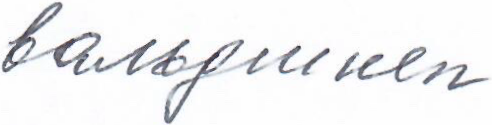вальдшнеп
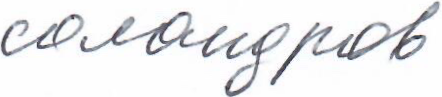соландров
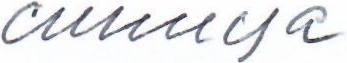синица
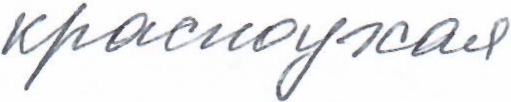красноухая
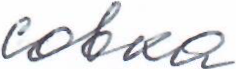совка
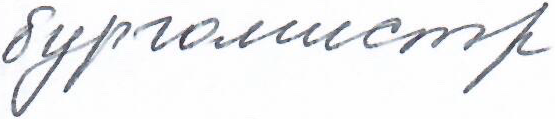бургомистр
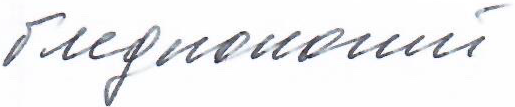бледноногий
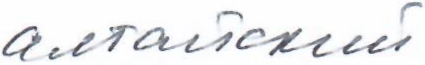алтайский
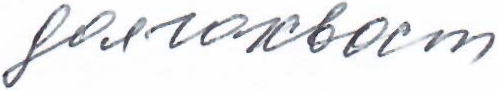долгохвост
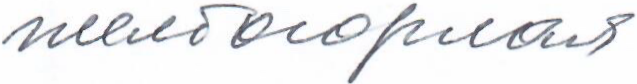желбогорлая
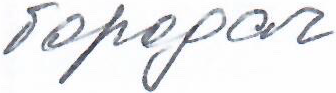бородач
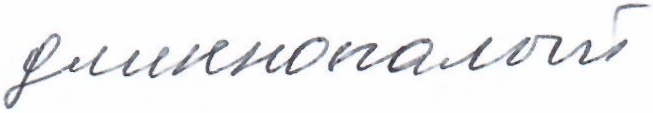длиннопалый
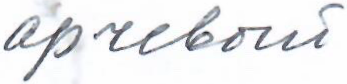арчевый
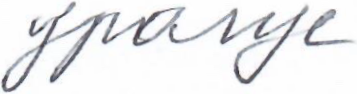урагус
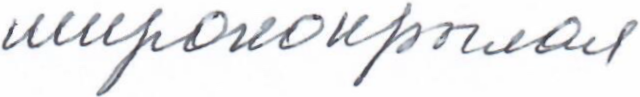ширококрылая
